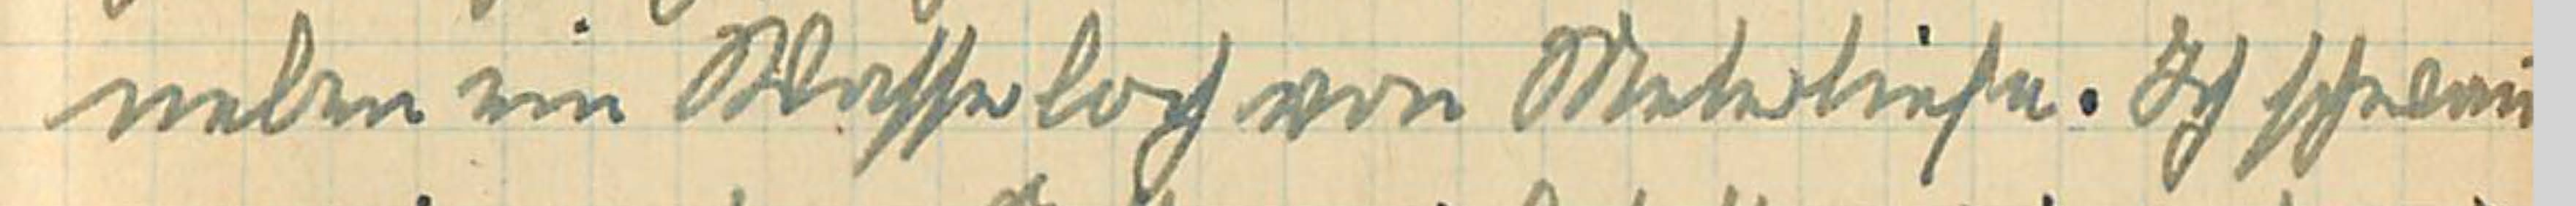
neben ein Wasserloch von Metertiefe. Ich schwamm
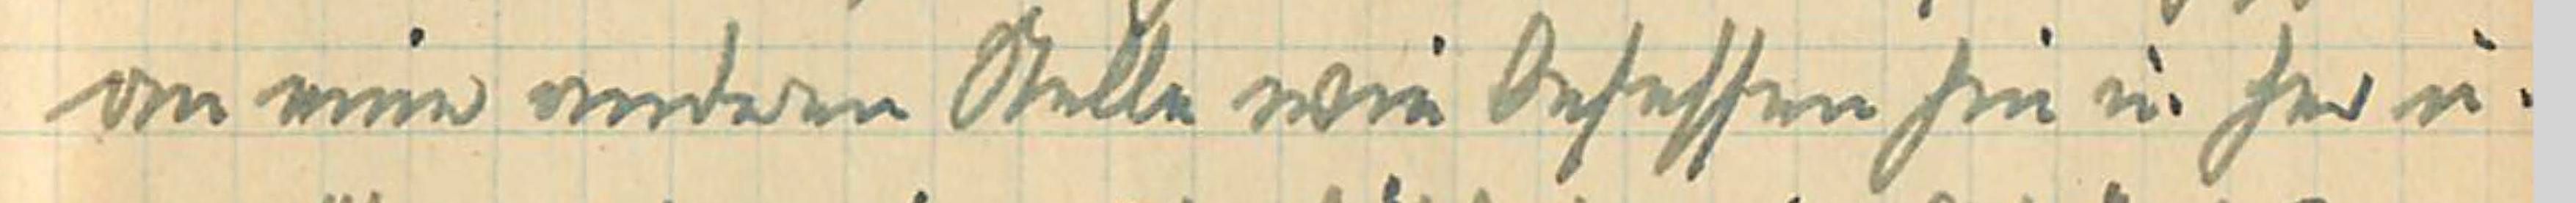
an einer anderen Stelle wie besessen hin u. her u.
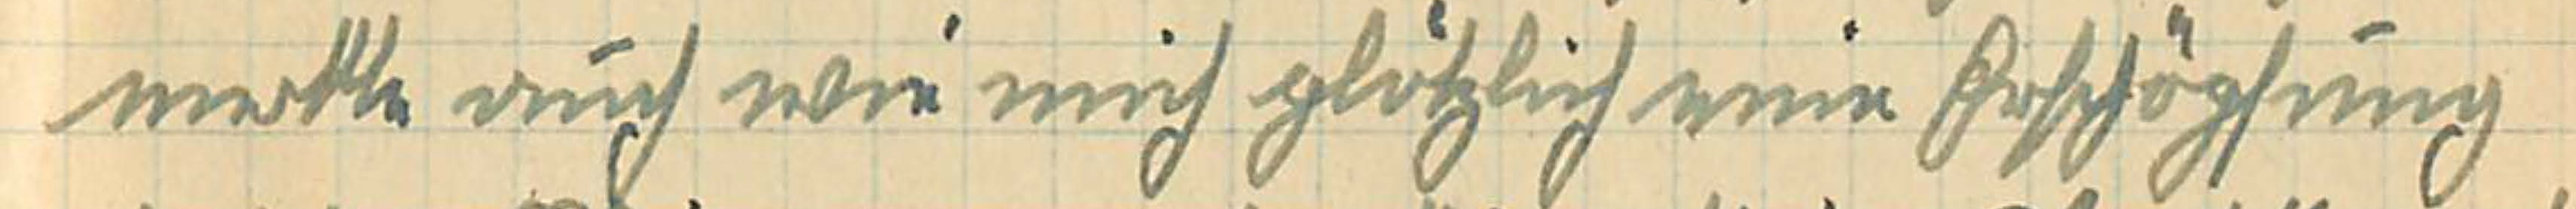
merkte auch wie mich plötzlich eine Erschöpfung
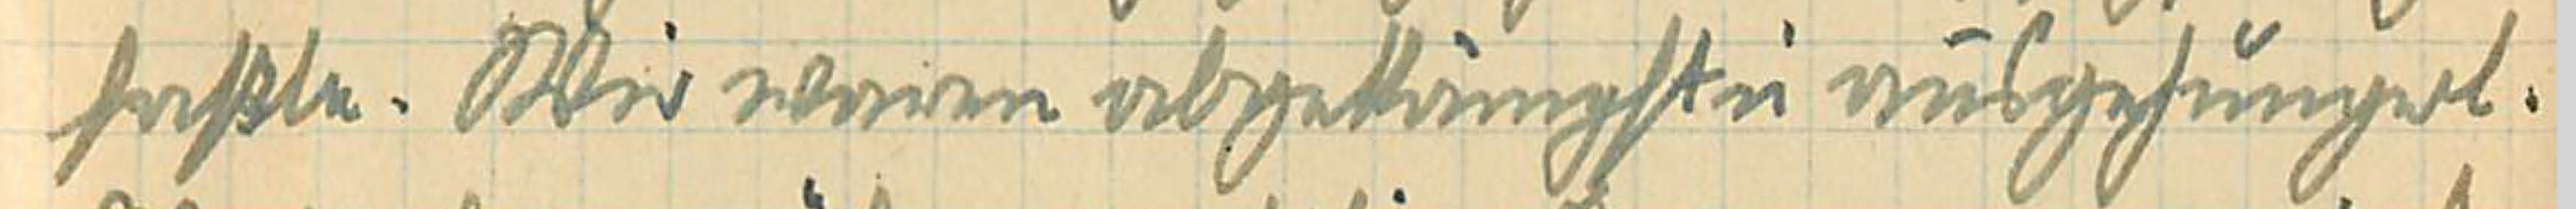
faßte. Wir waren abgekämpft u. ausgehungert.
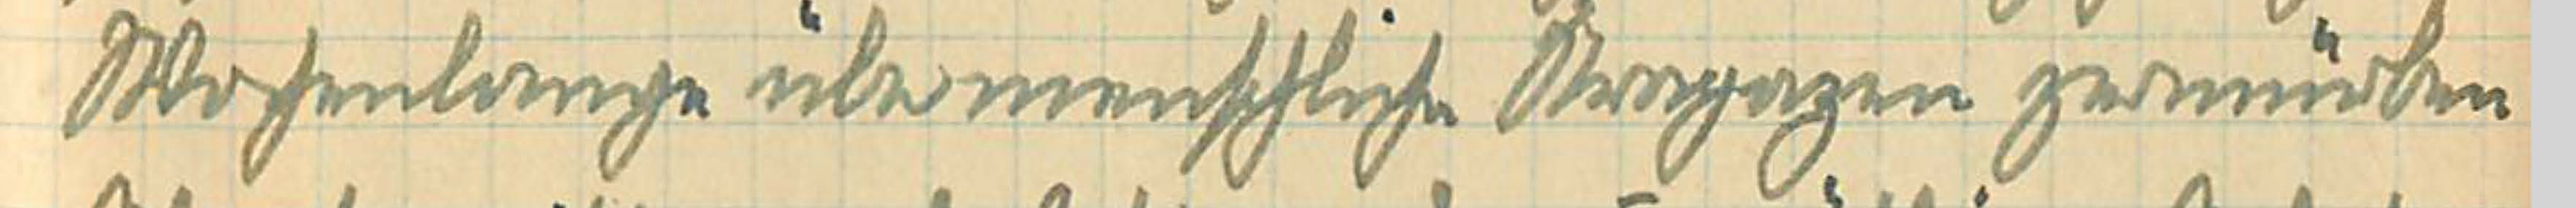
Wochenlange übermenschliche Strapazen zermürben.
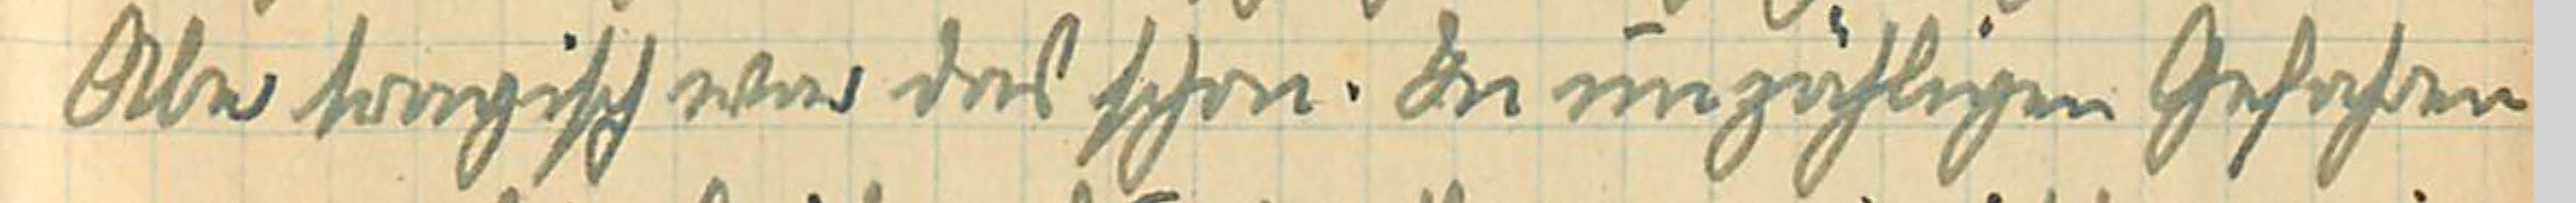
Aber tragisch war das schon. In unzähligen Gefahren
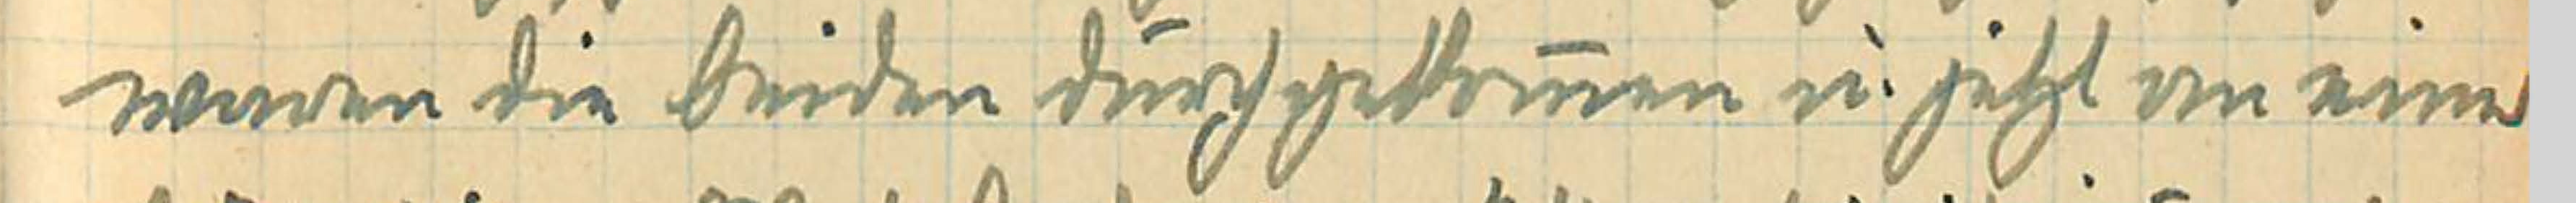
waren die beiden durchgekommen u. jetzt an einer
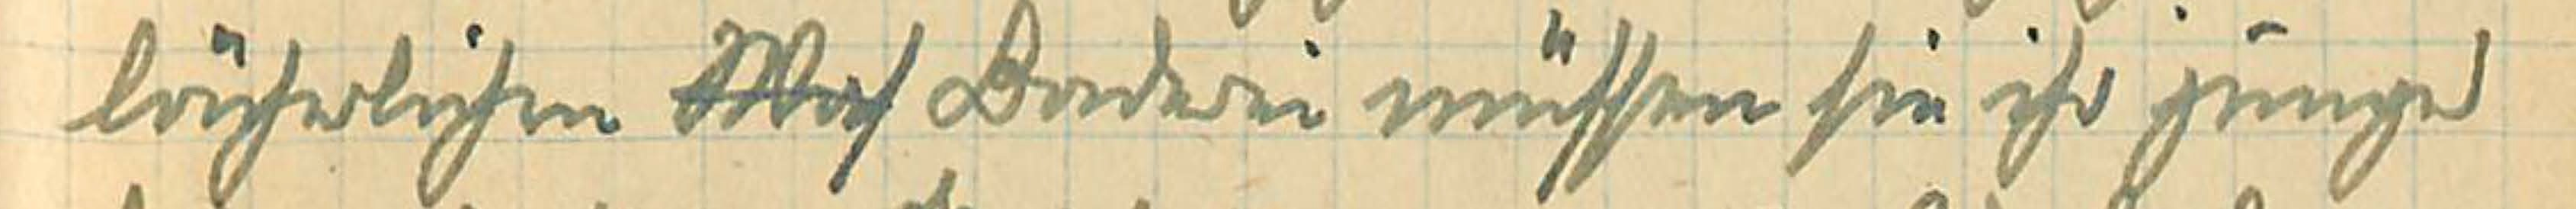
lächerlichen Was Baderei müssen sie ihr junges
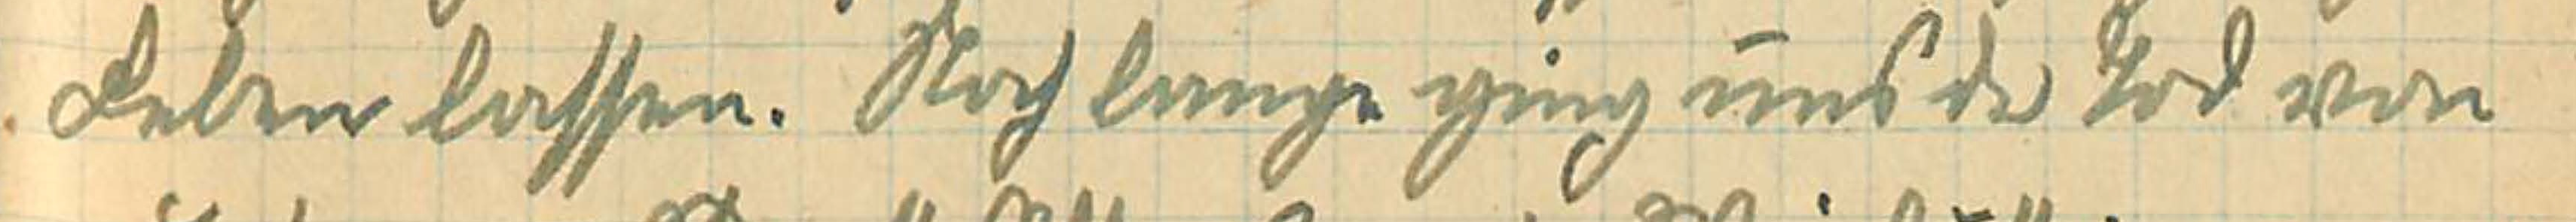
Leben lassen. Noch lange ging uns der Tod von
